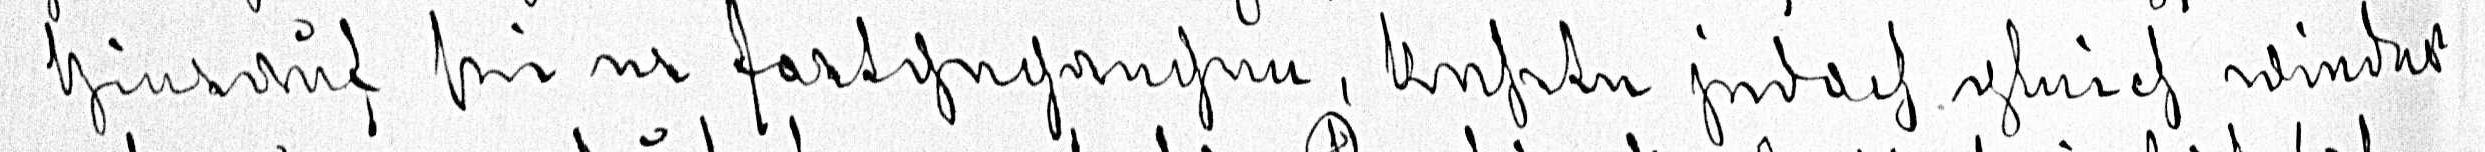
Hierauf sei er fortgegangen, kehrte jedoch gleich wieder
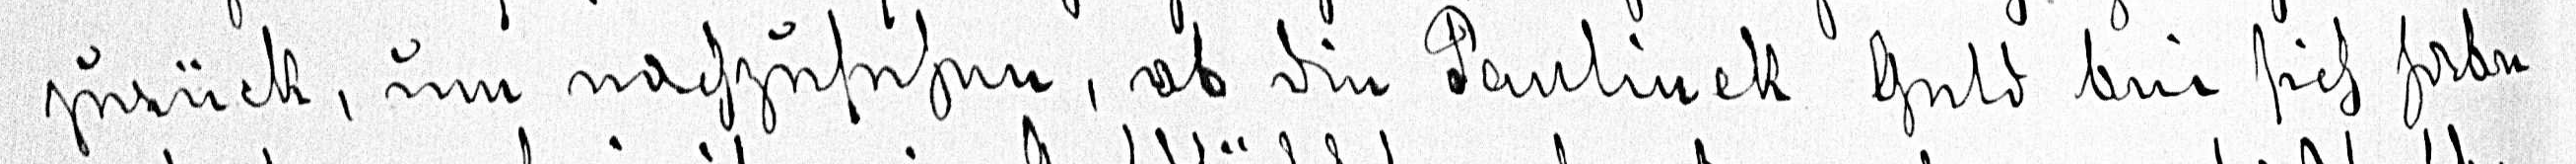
zurück, um nachzusehen, ob die Paulinek Geld bei sich habe
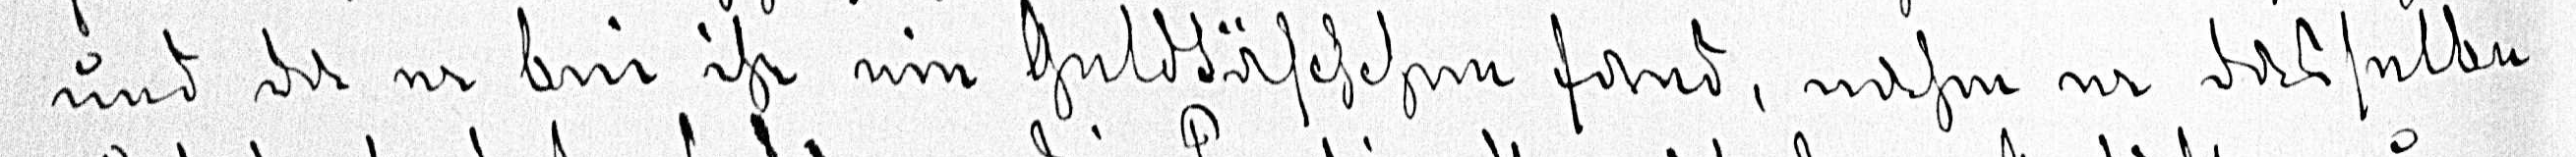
und da er bei ihr ein Geldtäschen fand, nahm er dasselbe
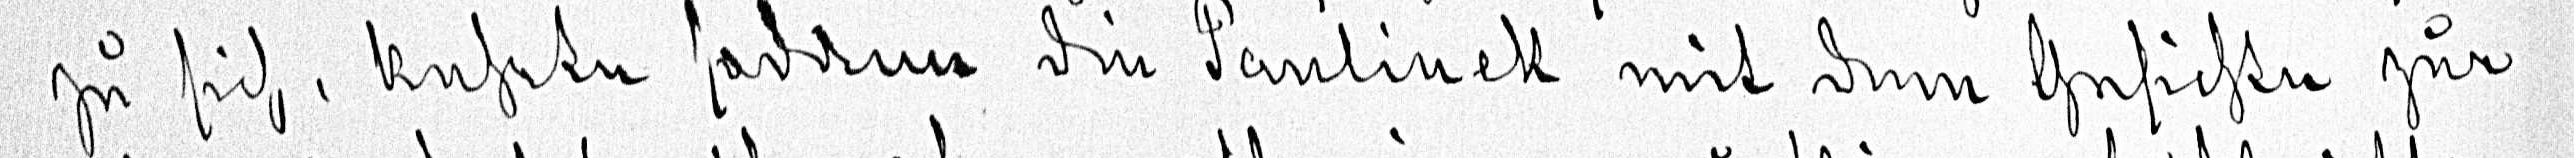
zu sich, kehrte sodann die Paulinek mit dem Gesichte zur
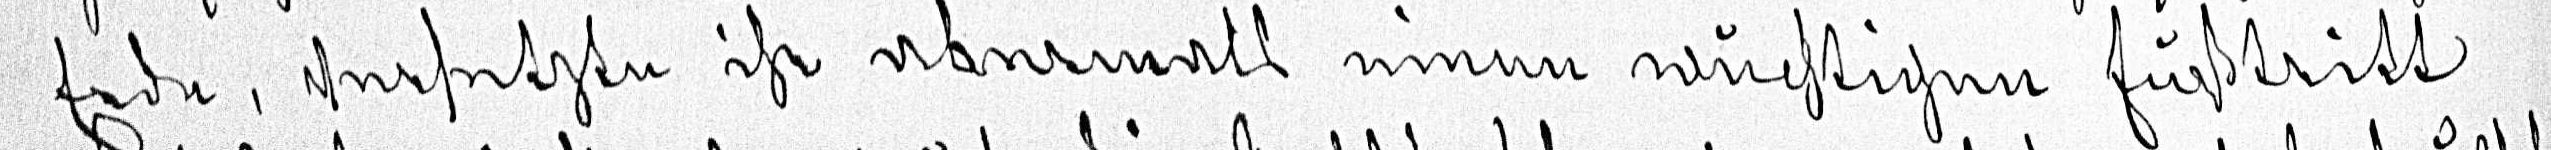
Erde, versetzte ihr abermals einen wüchtigen Fußtritt
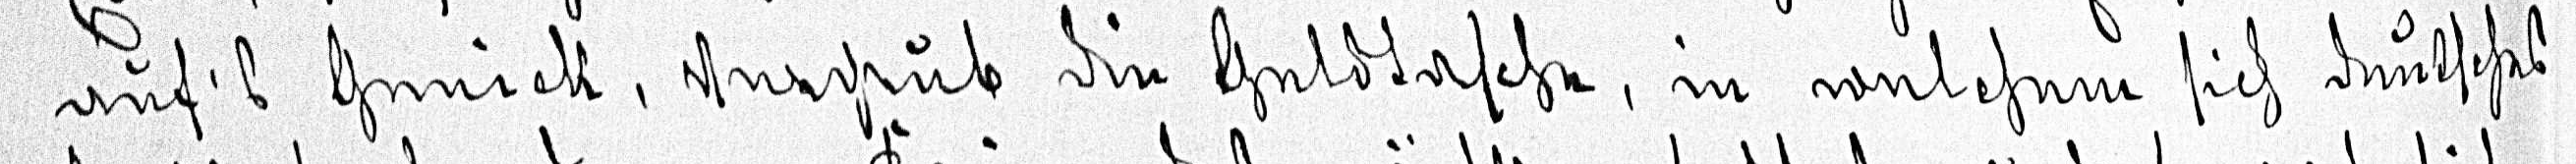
auf’s Genick, vergrub die Geldtasche, in welchem sich deutsches
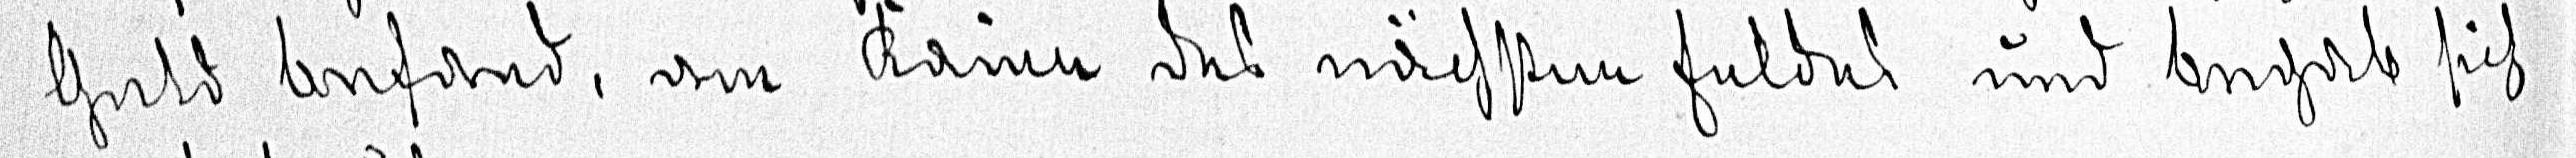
Geld befand, am Raine des nächsten Feldes und begab sich
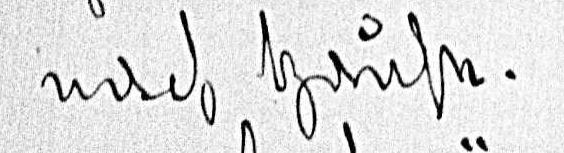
nach Hause.
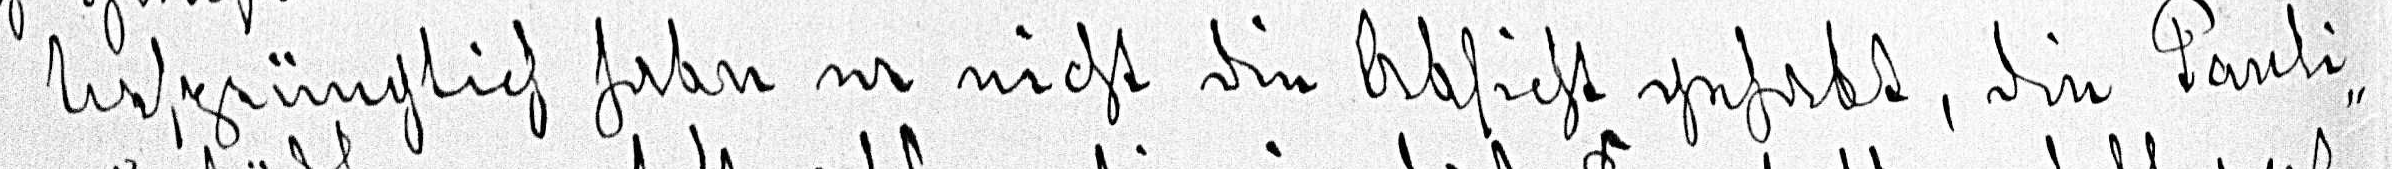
Ursprünglich habe er nicht die Absicht gehabt, die Pauli¬
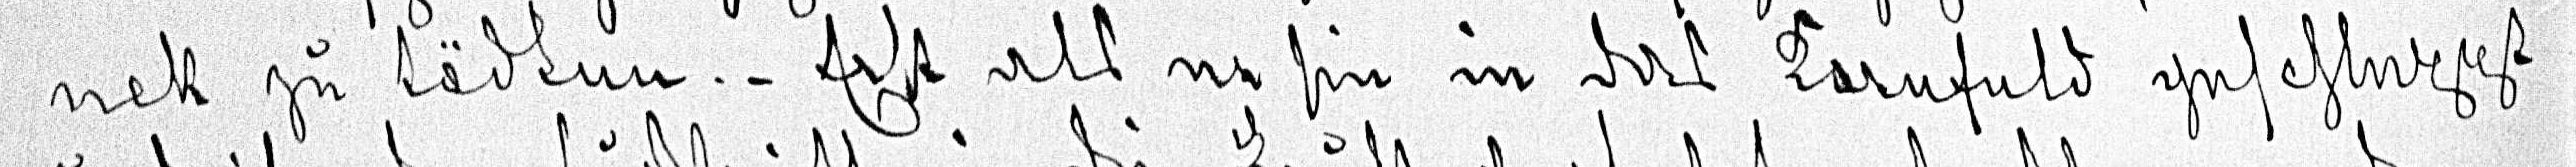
nek zu tödten. Erst als er sie in das Kornfeld geschleppt
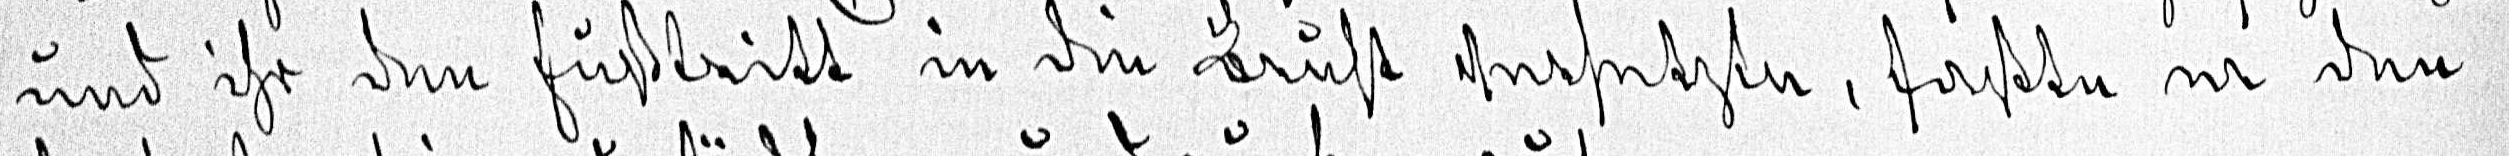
und ihr den Fußtritt in die Brust versetzte, faßte er den
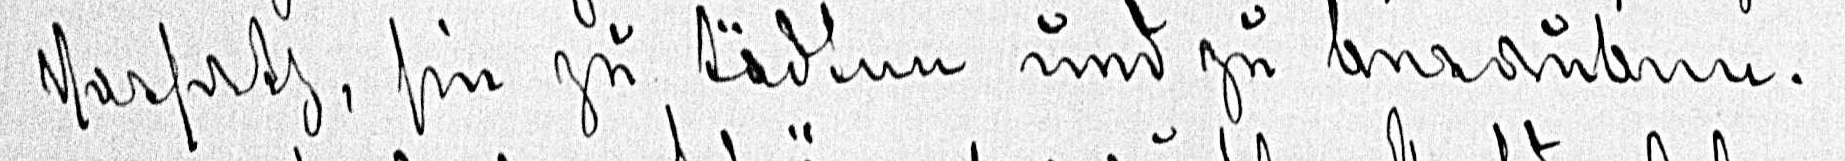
Vorsatz, sie zu tödten und zu berauben.
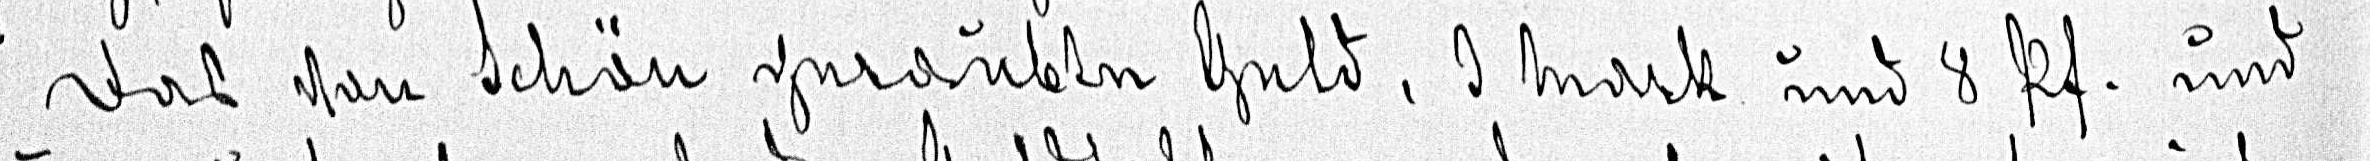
Das von Schön geraubte Geld, 3 Mark und 8 Pf. Und
